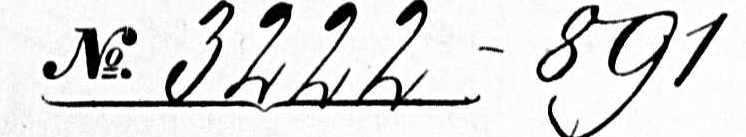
No. 3222 - 1891
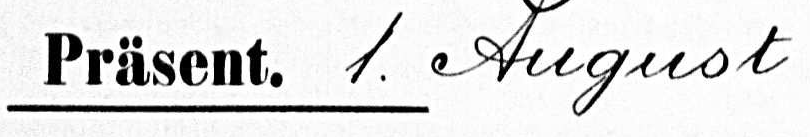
Präsent. 1. August
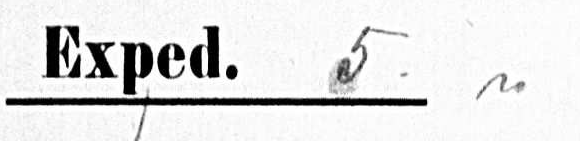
Exped. 5. „
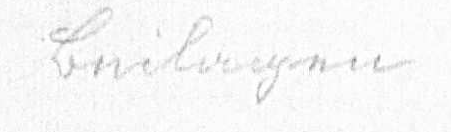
Beilagen
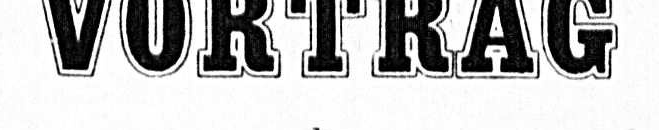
VORTRAG
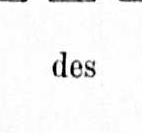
des
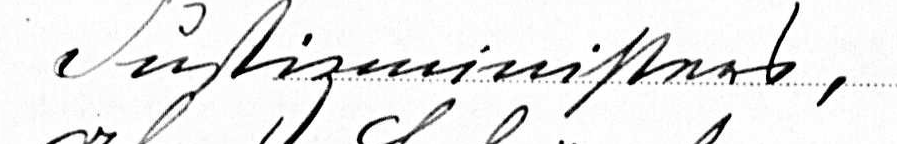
Justizministers
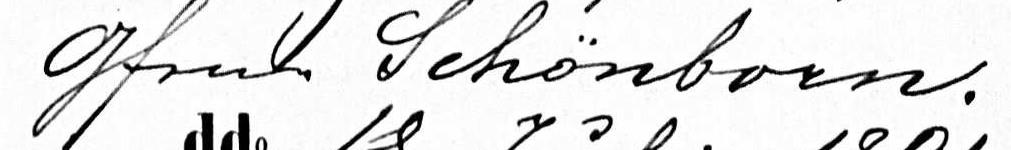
Gfen Schönborn
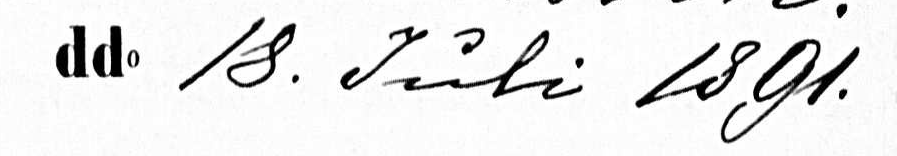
ddo 18. Juli 1891
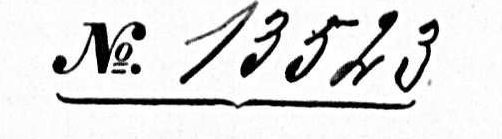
No. 13523
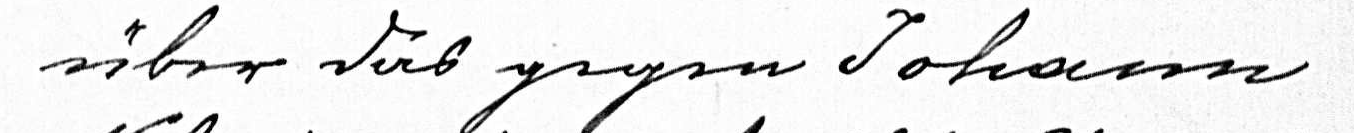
über das gegen Johann
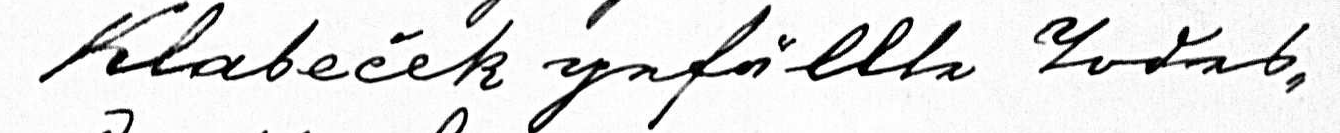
Klabeček gefällte Todes¬
